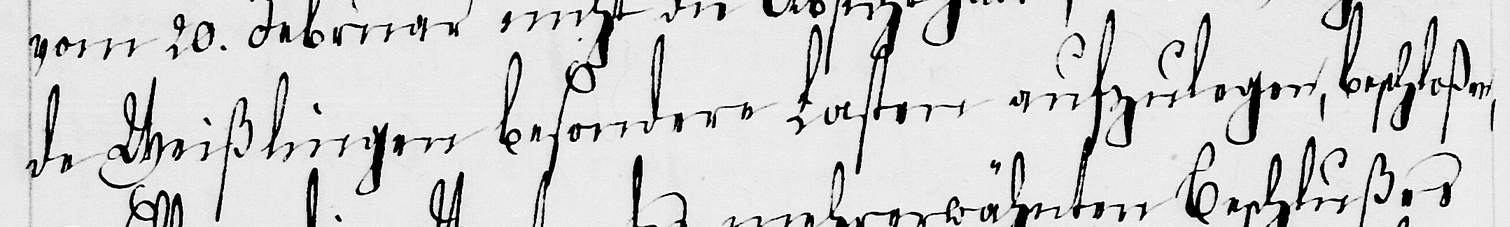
nde Weißlingen besondere Lasten aufzulegen, beschloß¬
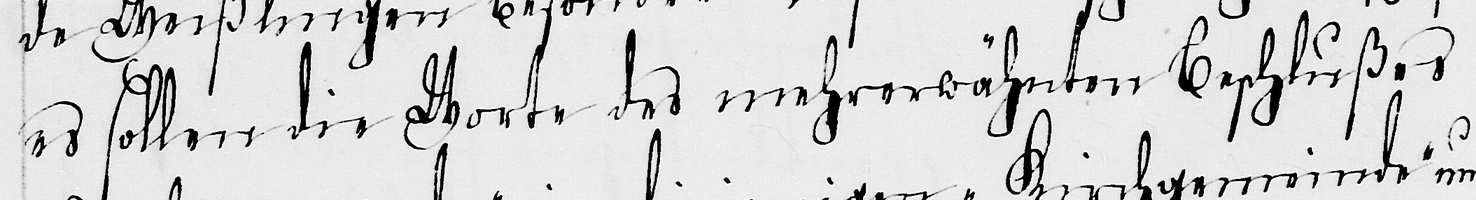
es sollen die Worte des mehrerwähnten Beschlußes
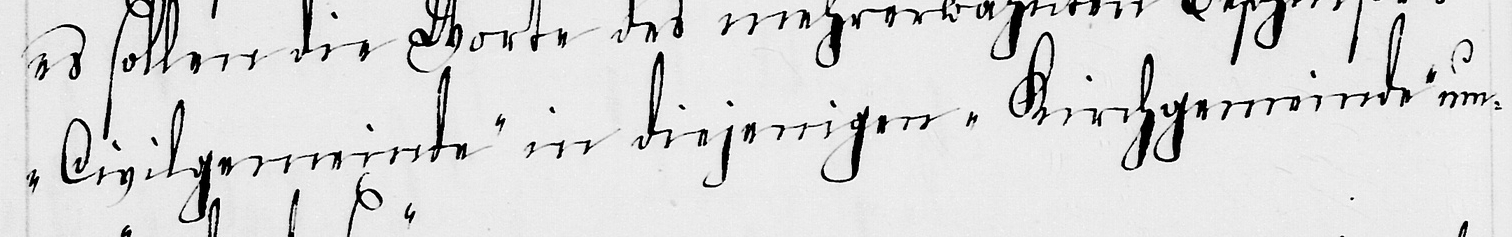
„Civilgemeinde“ in diejenigen „Kirchgemeinde“ um¬
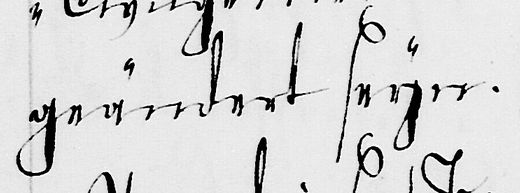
geändert seyn.
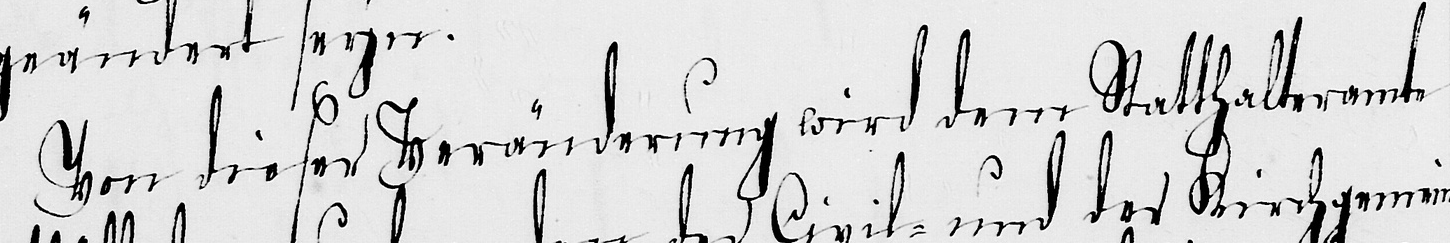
Von dieser Veränderung wird dem Statthalteram¬
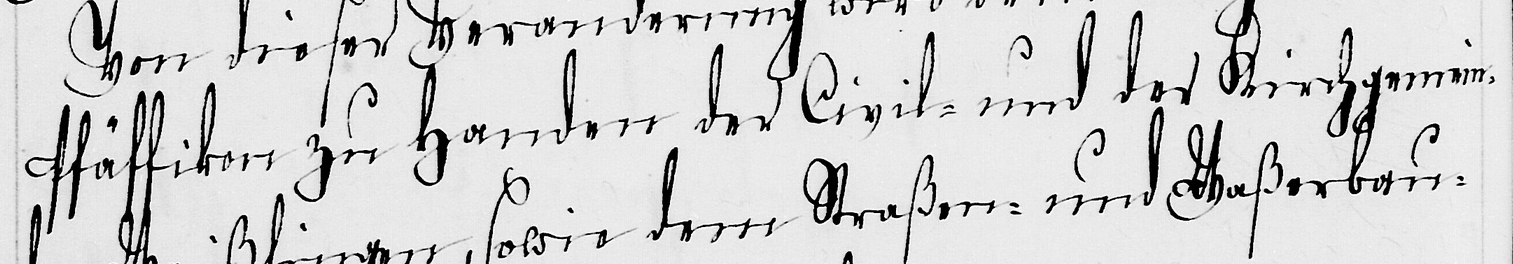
Pfäffikon zu Handen der Civil- und der Kirchgemei¬
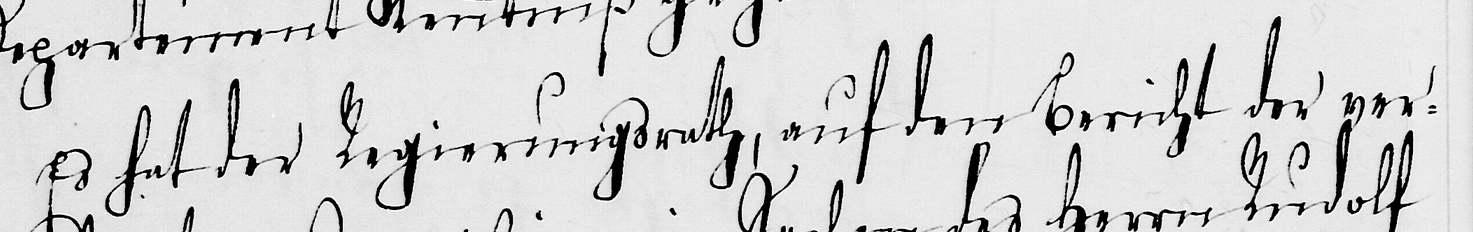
Es hat der Regierungsrath, auf den Bericht der ver¬
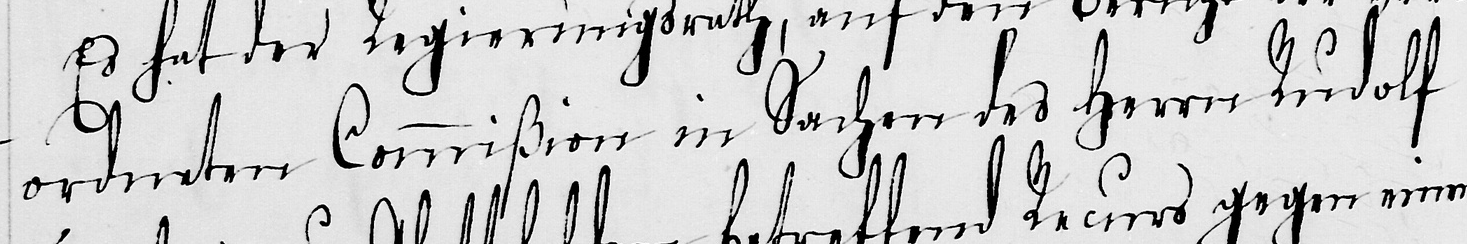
ordneten Commißion in Sachen des Herrn Rudolf
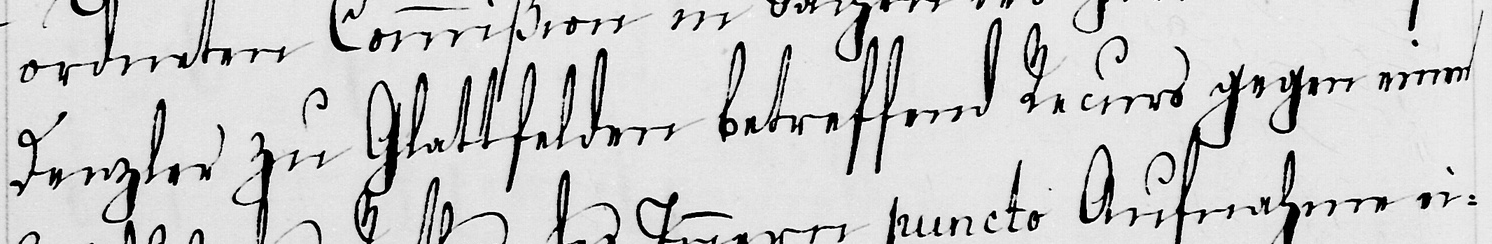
Denzler zu Glattfelden betreffend Recurs gegen einen
